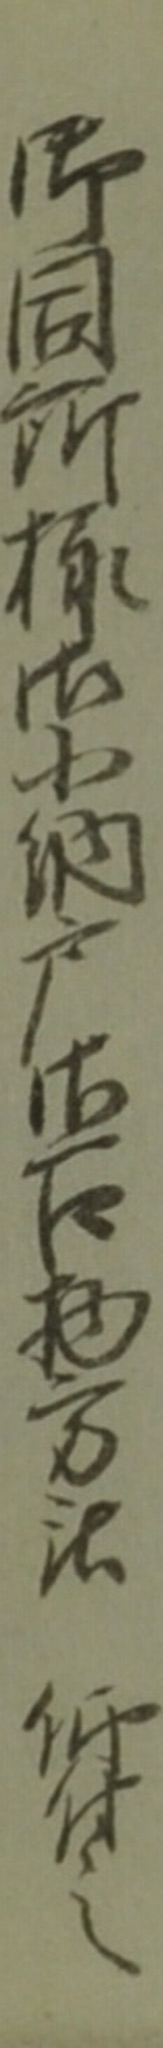御同所様御小納戸御召物方被仰付之
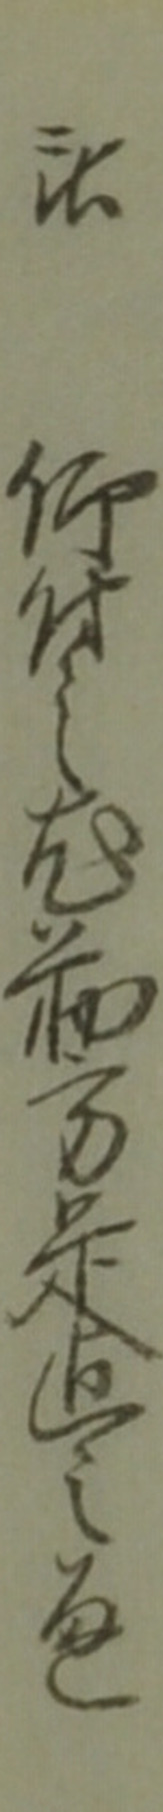被仰付之尤勤方是迄之通
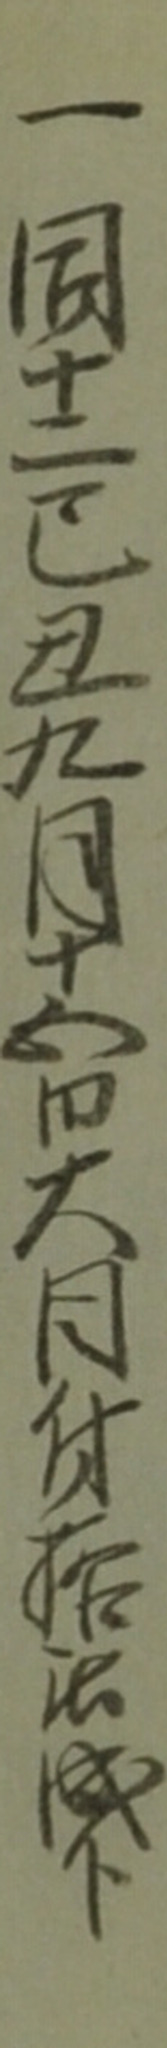同十二己丑九月十五日大目付格被成下
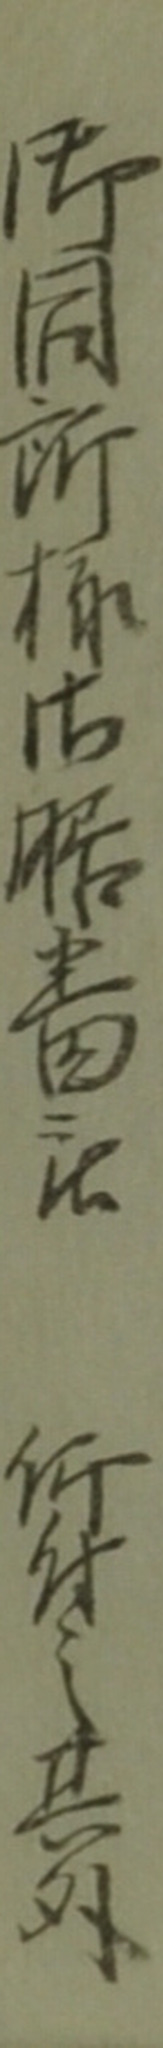御同所様御膳番被仰付之其外
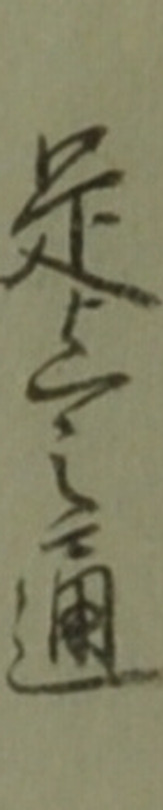是迄之通
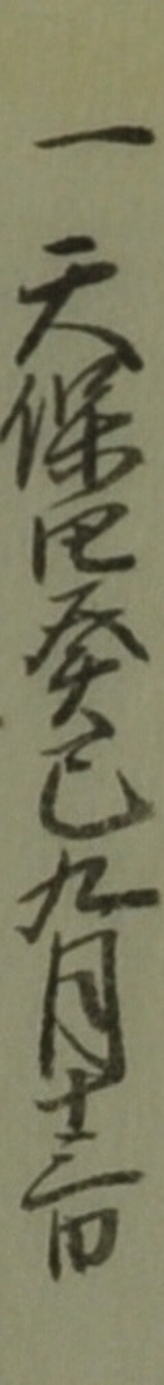一天保四癸巳九月十三日
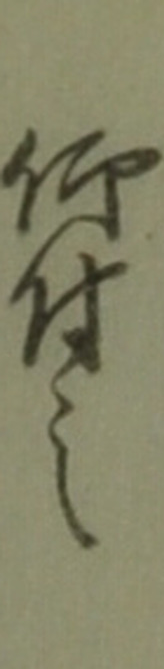仰付之
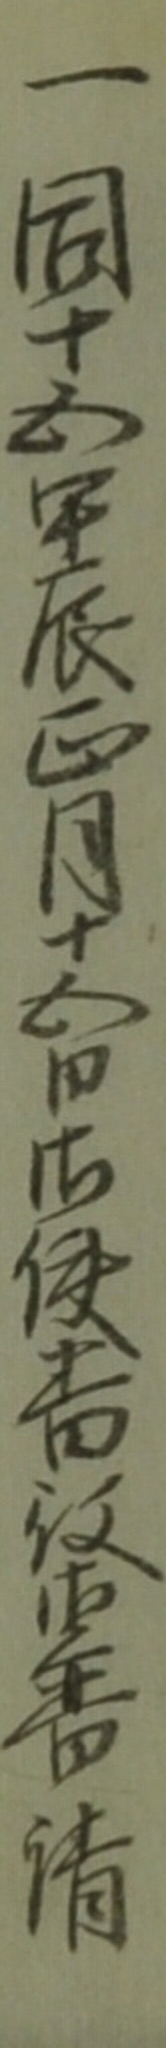一同十五甲辰正月十五日御使番役御普請
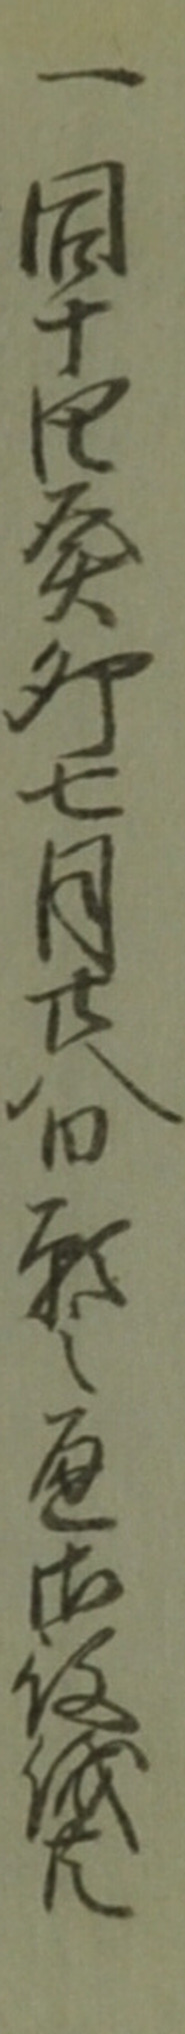一同十四癸卯七月廿八日願之通御役儀共
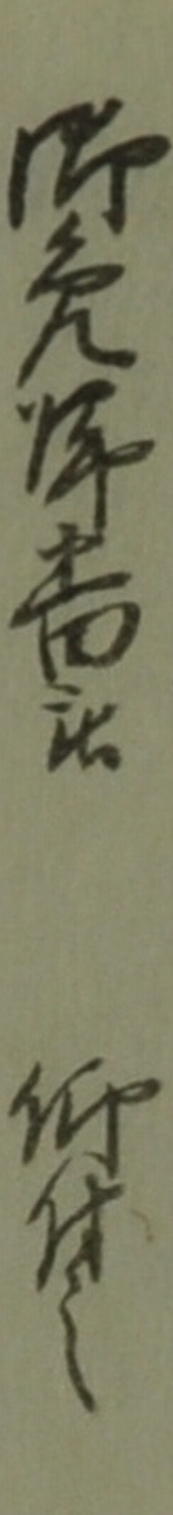御免帰番被仰付之
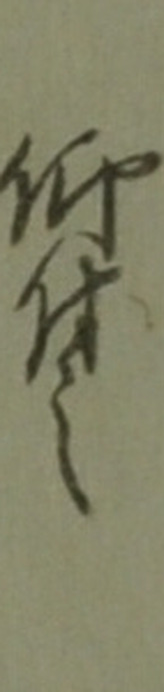仰付之
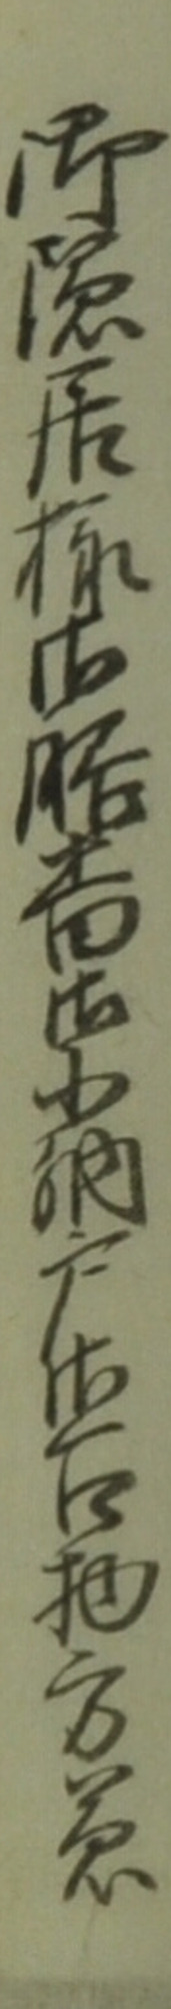御隠居様御膳番御小納戸御召物方兼
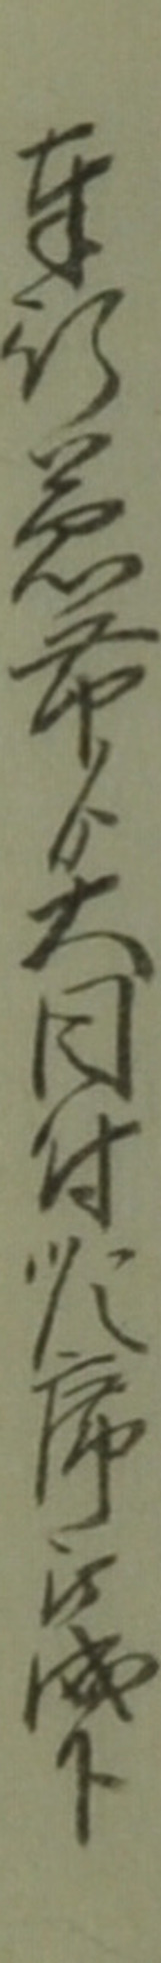奉行兼帯ゟ大目付順席被被成下

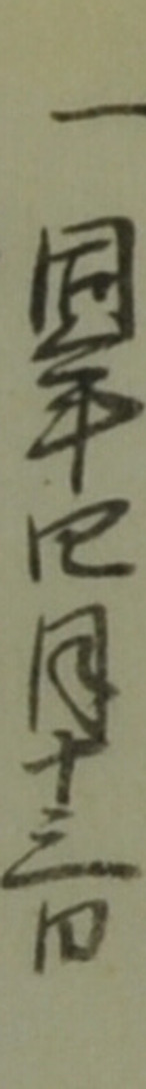一同年四月十三日
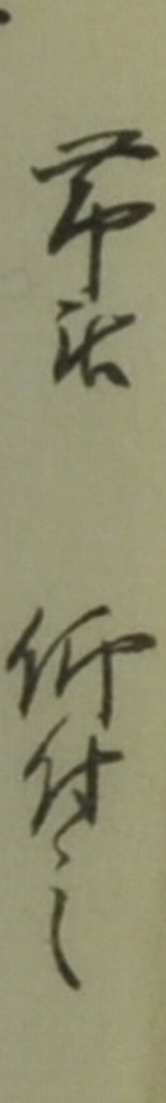帯被仰付之
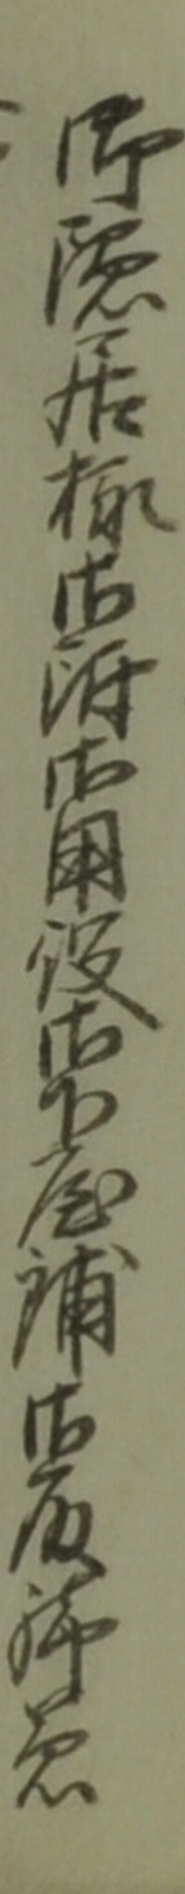御試役御隠居様御附御用役御下屋敷御取締兼
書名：諸御役代々録（五）
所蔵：伊那市立高遠町図書館・合同会社AMANE
